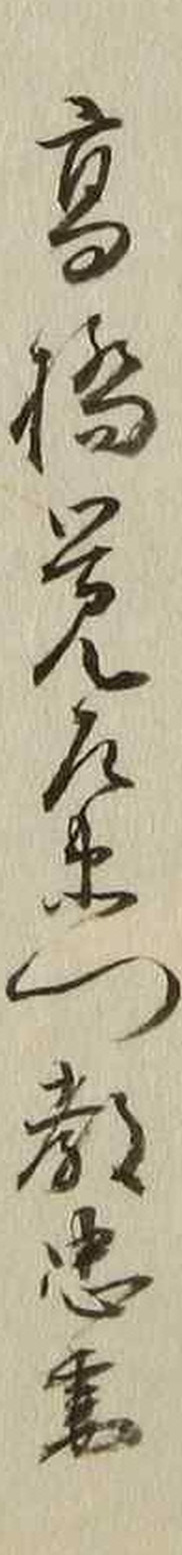女高橋覚左衛門教忠妻
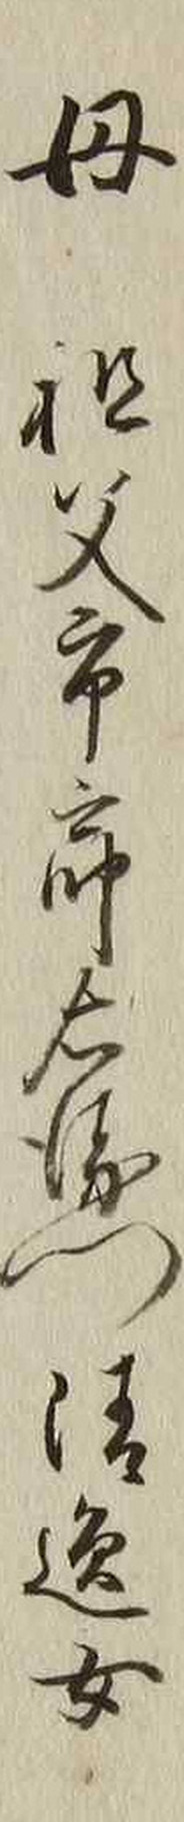母祖父市郎右衛門清逸女
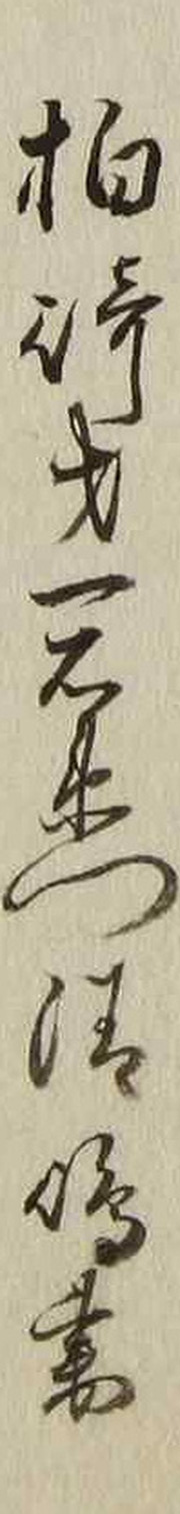女柏崎才一右衛門清嶋妻
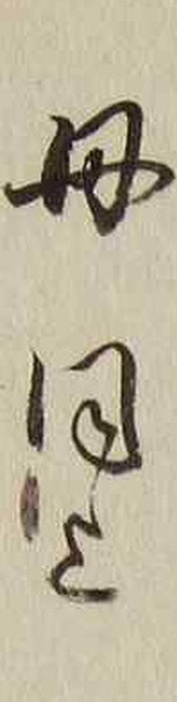母同上

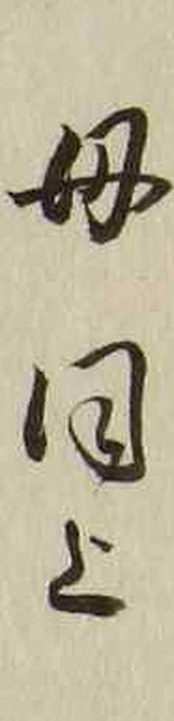母同上
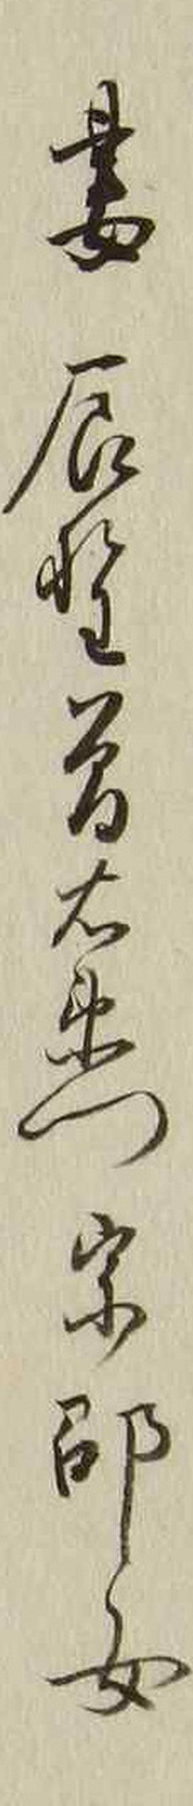妻辰野曽右衛門宗邵女
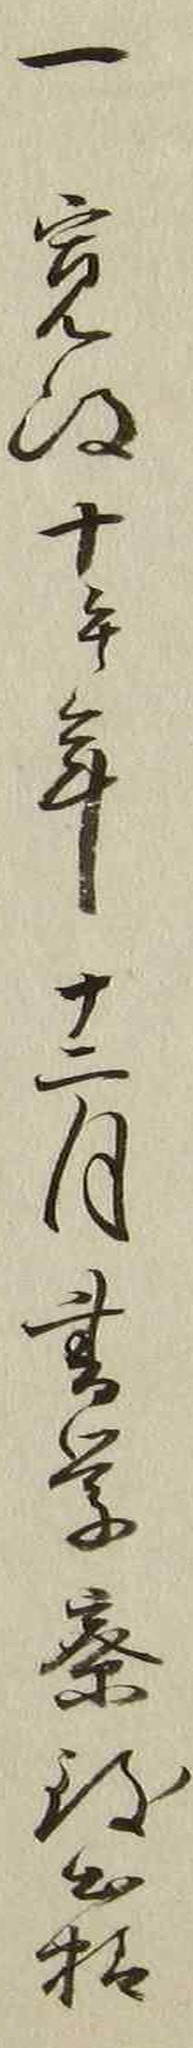一寛政十午年十二月書学寮致出精
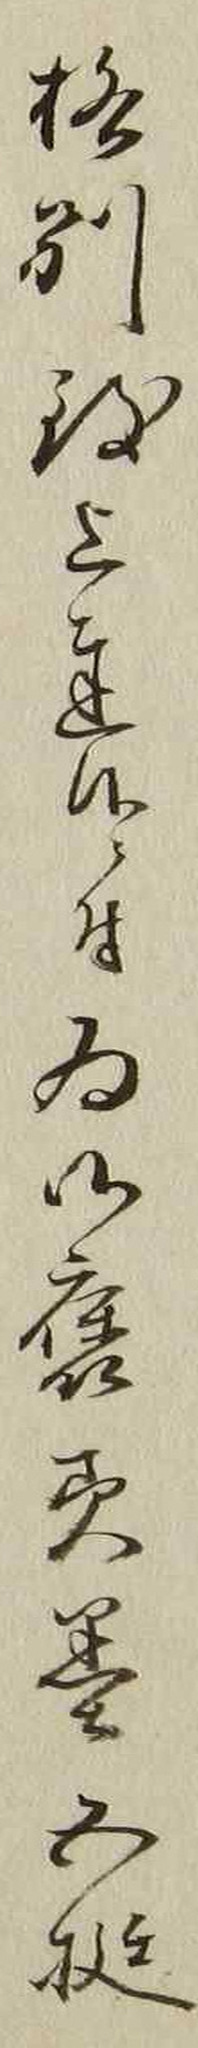格別致上達候ニ付為御褒美墨五挺
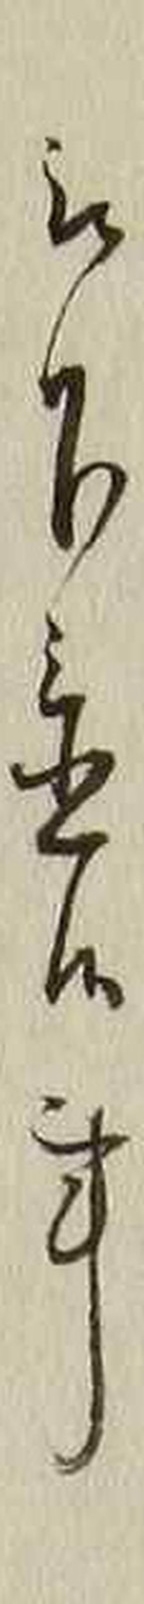被下置候事
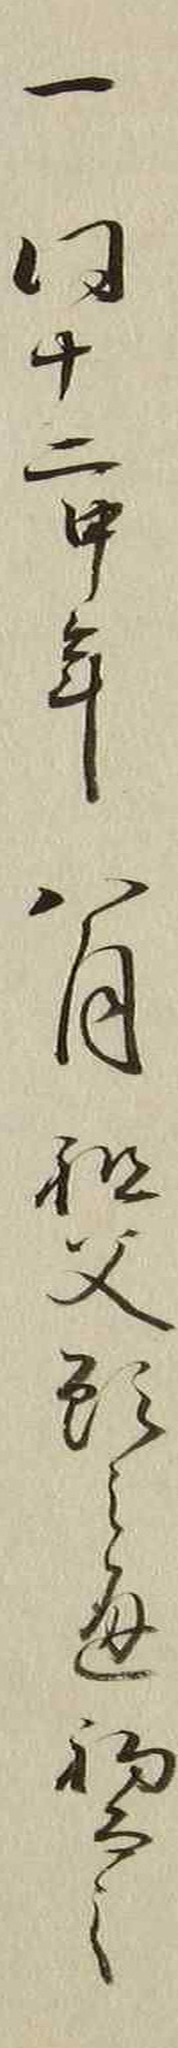一同十二申年八月祖父願之通初而之
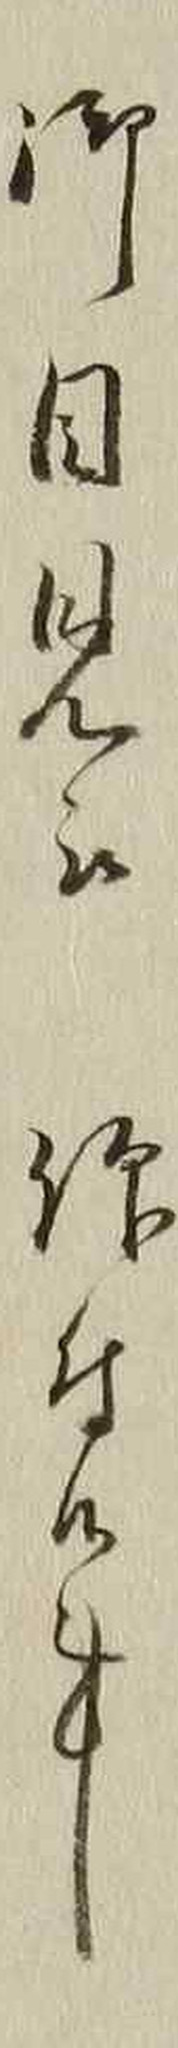御目見被仰付候事
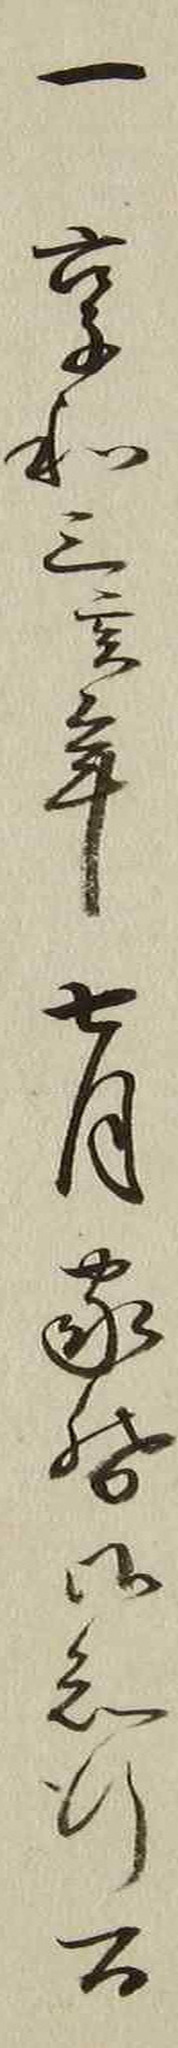一享和三亥年七月家督御知行百
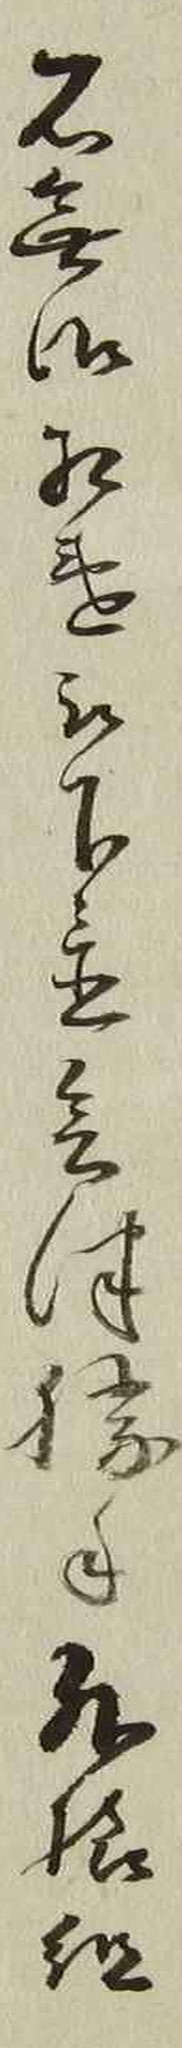石無御相違被下置会津勝手外様組
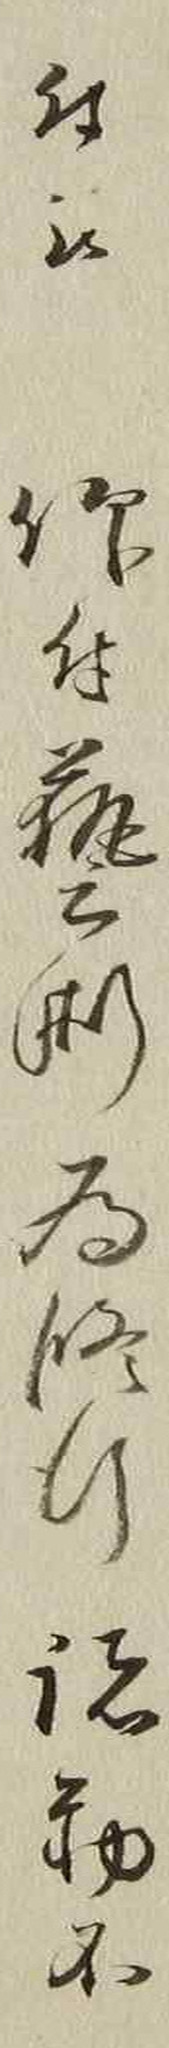付被仰付芸術為修行諸勤不
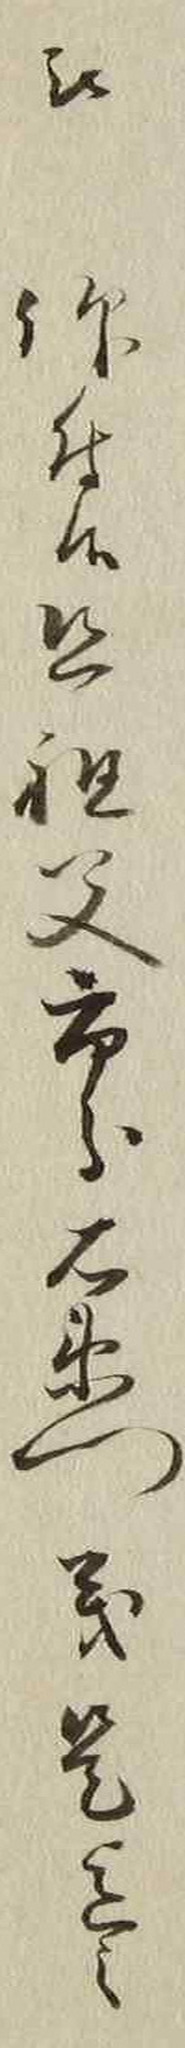被仰付候且祖父市郎右衛門義是迄之
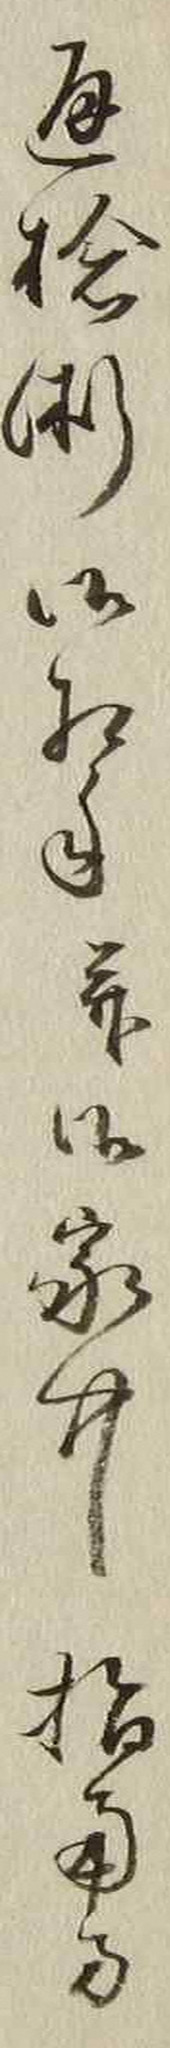通槍術御相手并御家中指南方
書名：諸士系譜　巻之28　い之部28
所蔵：会津若松市立会津図書館
